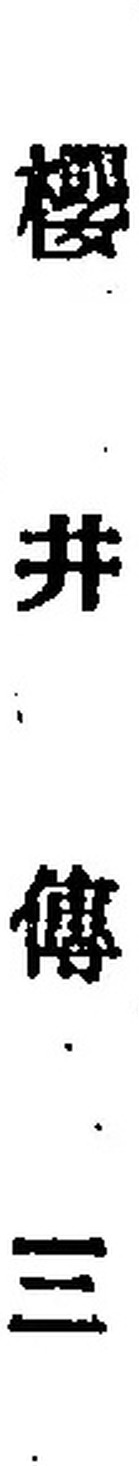桜井伝三
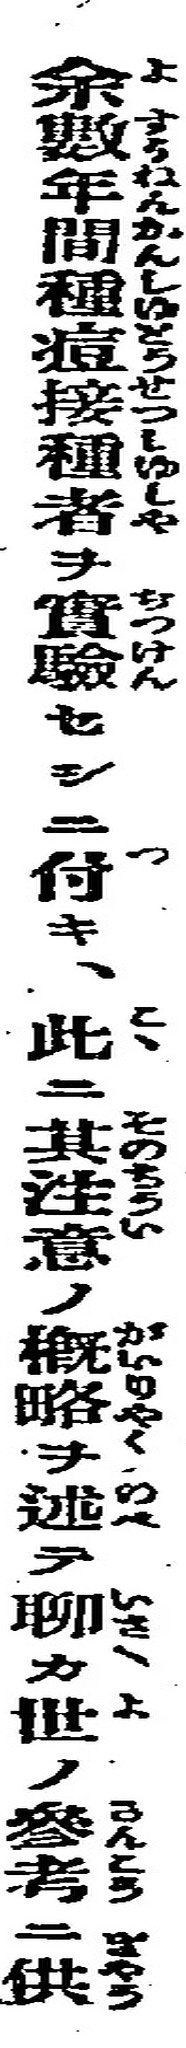余数年間種痘接種ヲ実験セシニ付キ、此ニ其注意ノ概略ヲ述テ聊カ世ノ参考ニ供
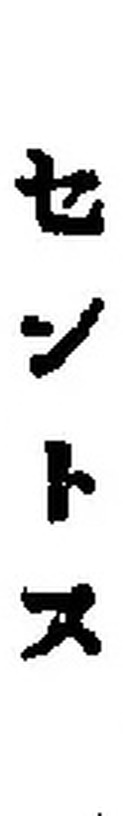セントス
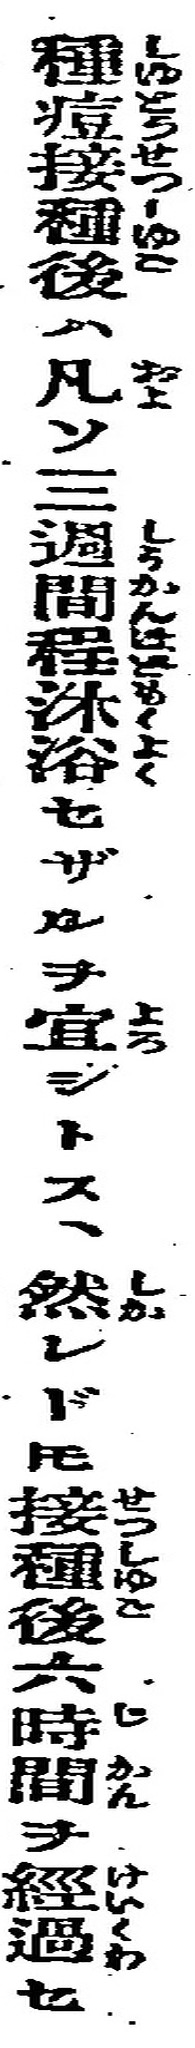種痘摂取後ハ凡ソ三週間程沐浴セザルヲ宜シトス、然レドトモ接種後六時間ヲ経過セ
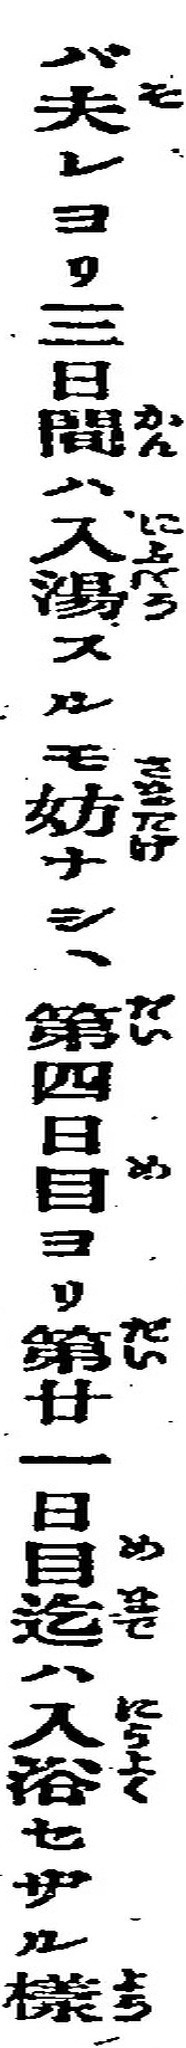バ夫レヨリ三日間ハ入湯スルモ妨ナシ、第四日目ヨリ第廿一日目迄ハ入浴セザル様
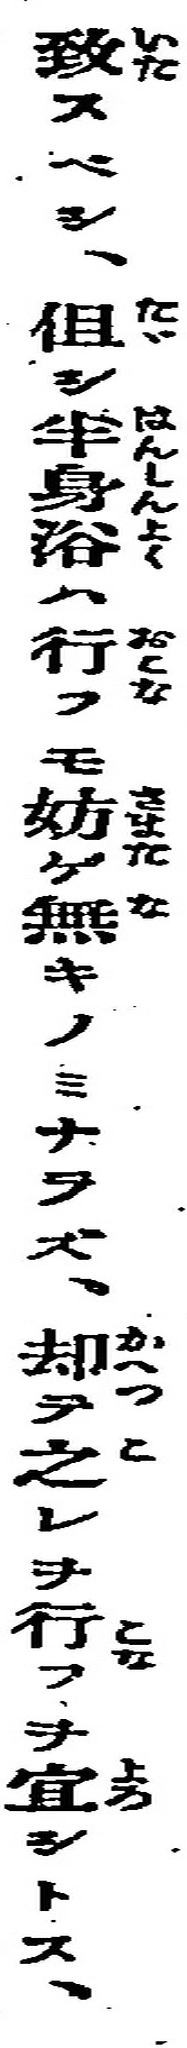致スベシ、但シ半身浴ハ行フモ妨ゲ無キノミナラズ、却テ之レヲ行フヲ宜シトス、
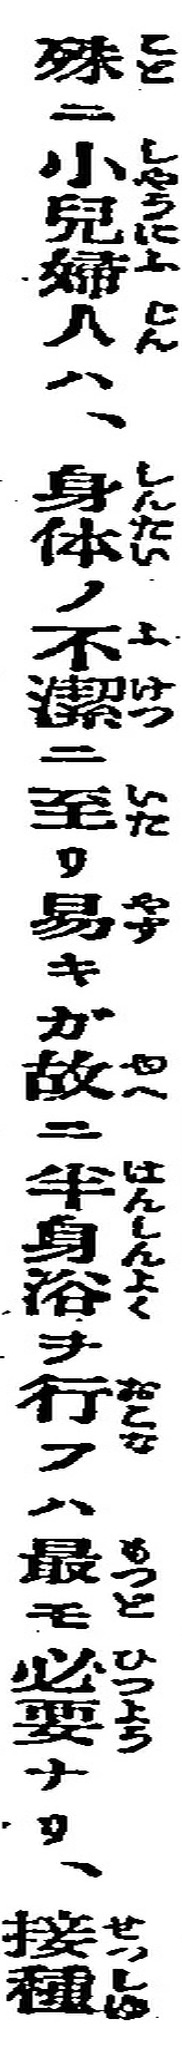殊ニ小児婦人ハ、身体ノ不潔ニ至リ易キガ故ニ半身浴ヲ行フハ最モ必要ナリ、接種
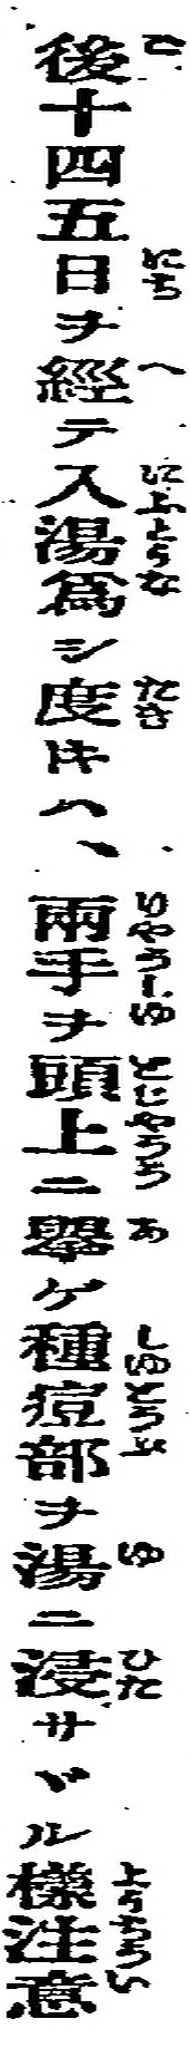後十四五日ヲ経テ入湯為シ度トキハ、両手ヲ頭上ニ挙ゲ種痘部ヲ湯ニ浸サヾル様注意
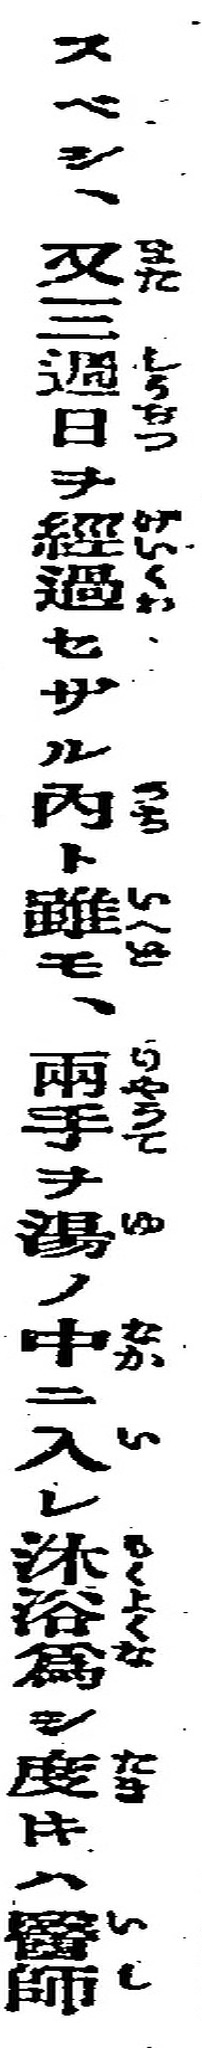スベシ、又三週日ヲ経過セザル内ト雖モ、両手ヲ湯ノ中ニ入レ沐浴為シ度トキハ医師
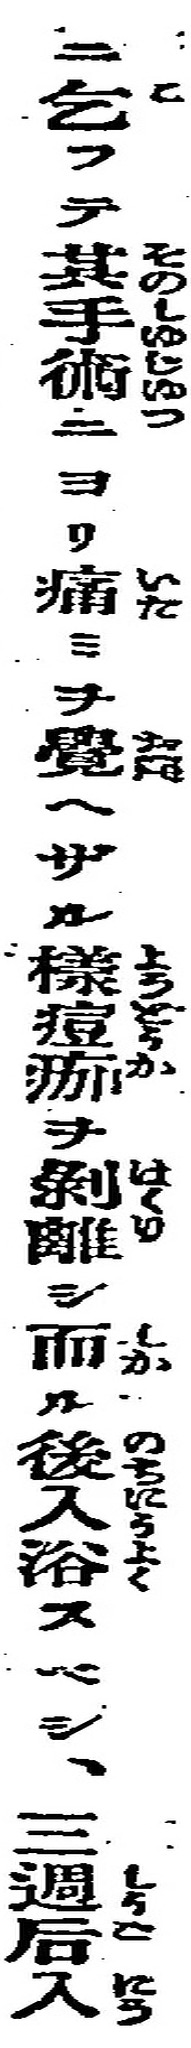ニ乞フテ其手術ニヨリ痛ミヲ覚ヘザル様痘痂ヲ剥離シ而ル後入浴スベシ、三週后入
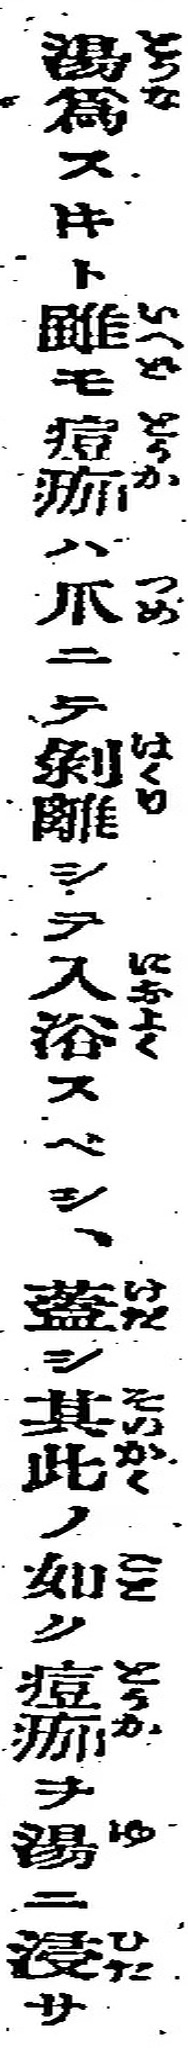湯為ストキト雖モ痘痂ハ爪ニテ剥離シテ入浴スベシ、蓋シ其此ノ如ク痘痂ヲ湯ニ浸サ
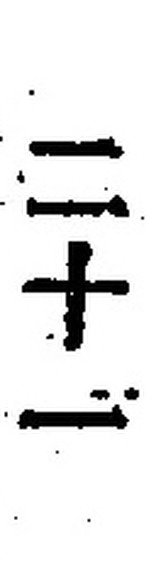二十一

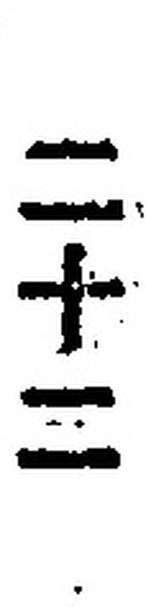二十二
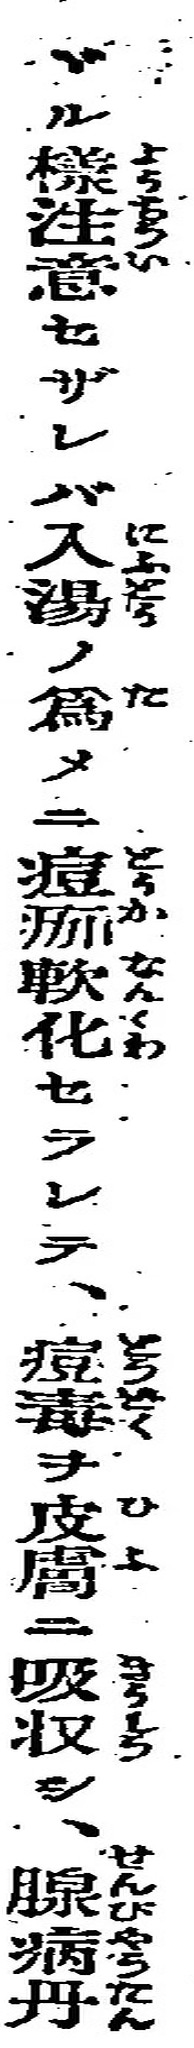ヾル様注意セザレバ入湯ノ為メニ痘痂軟化セラレテ、痘毒ヲ皮膚ニ吸収シ、腺病丹
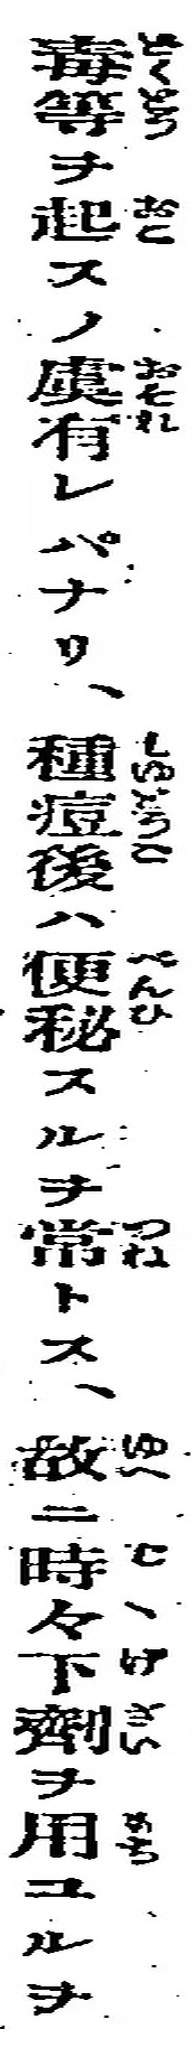毒等ヲ起スノ虞有レパナリ、種痘後ハ便秘スルヲ常トス、故ニ時々下剤ヲ用ユルヲ
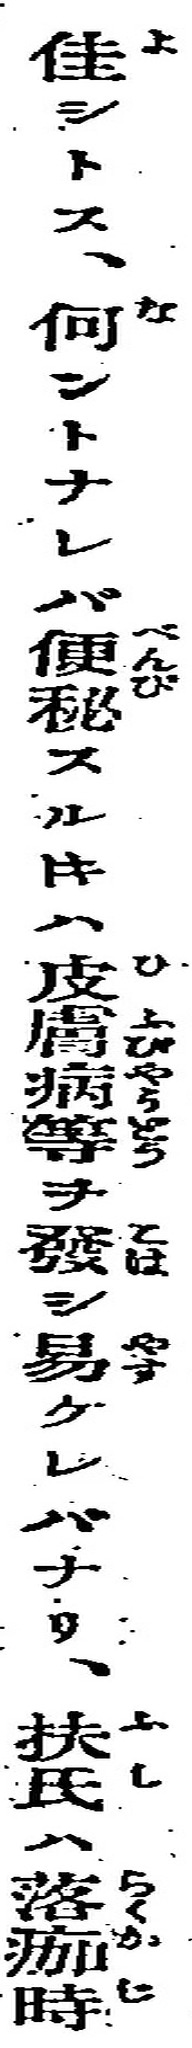佳シトス、何ントナレバ便秘スルトキハ皮膚病等ヲ発シ易ケレバナリ、扶氏ハ落痂時
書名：天然痘予防注意兼種痘者之注意
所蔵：国立国会図書館 National Diet Library, JAPAN
